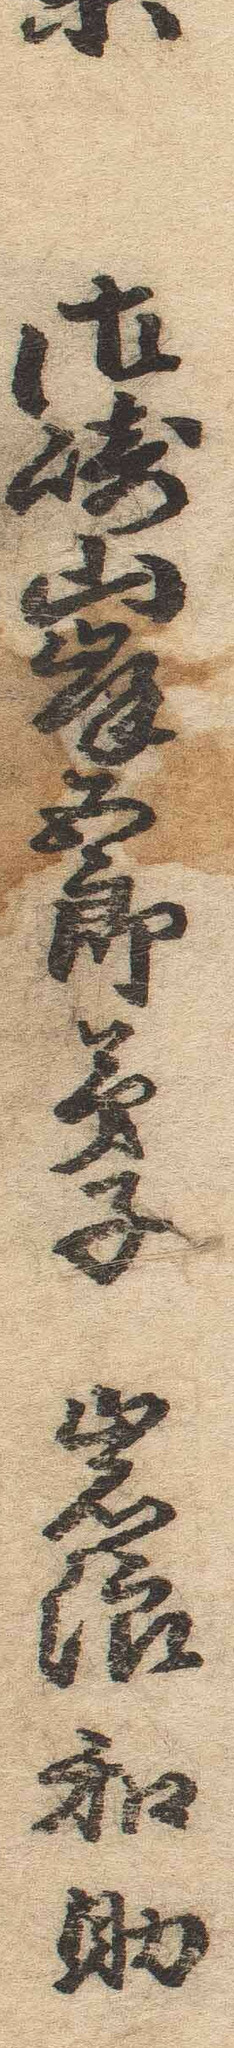京御崎山峯五郎弟子岩浪和助

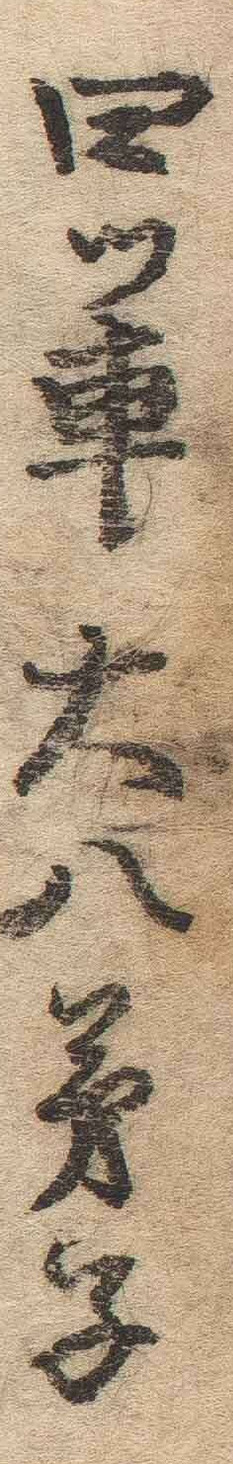京四ッ車大八弟子
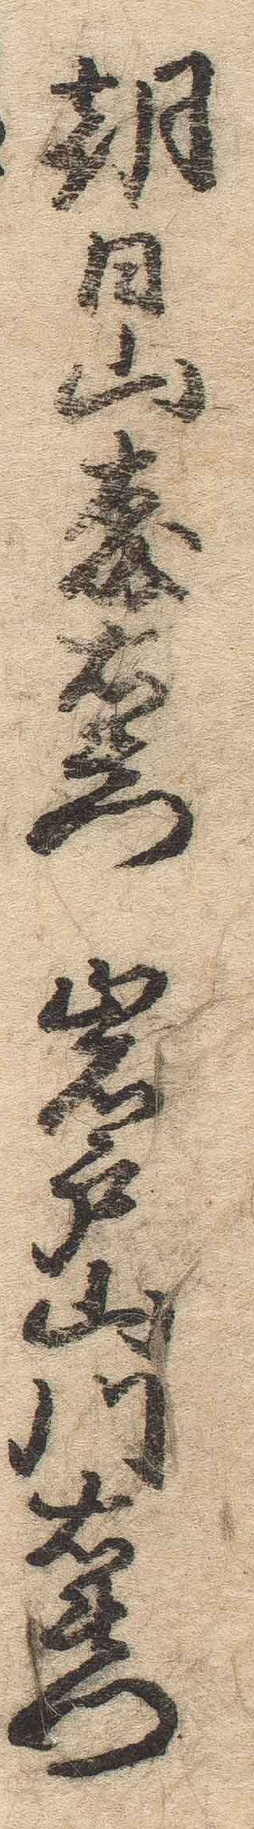朝日山森右衛門岩戸山門右衛門
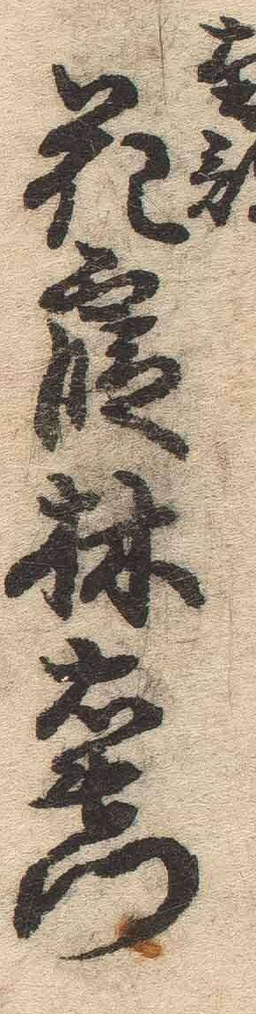花霞林右衛門
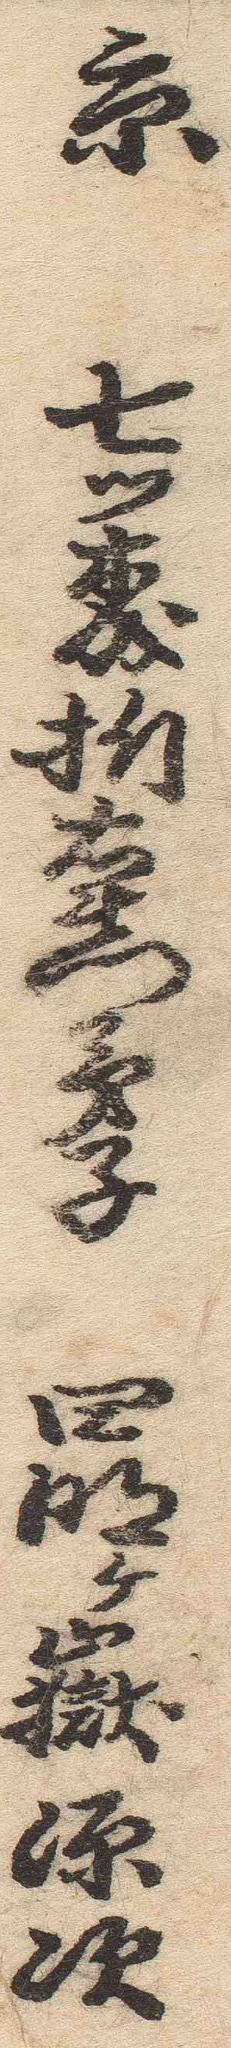京七ッ森折右衛門弟子四明ケ嶽源次
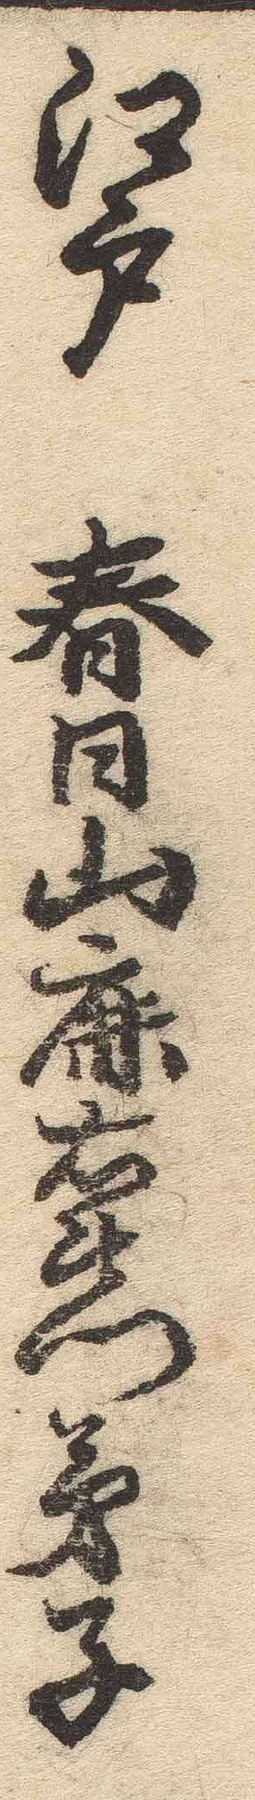江戸春日山鹿右衛門弟子
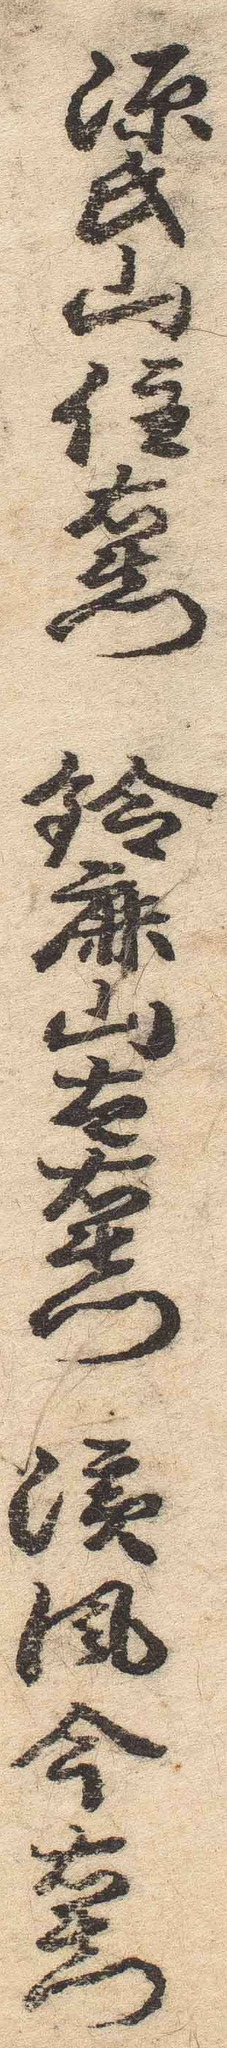源氏山住右衛門鈴鹿山太右衛門浜風今右衛門
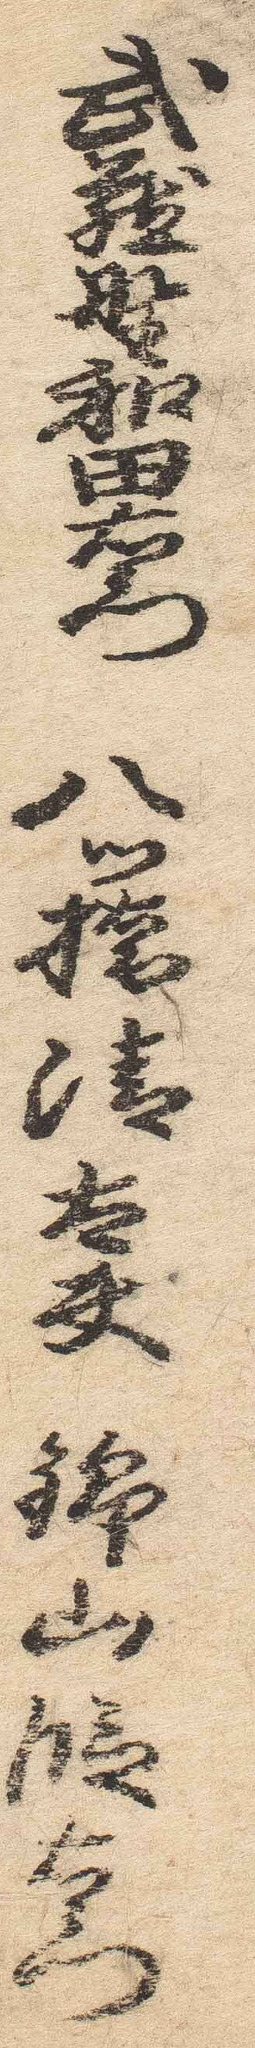武蔵野和田右衛門八ッ橋清太夫錦山段右衛門
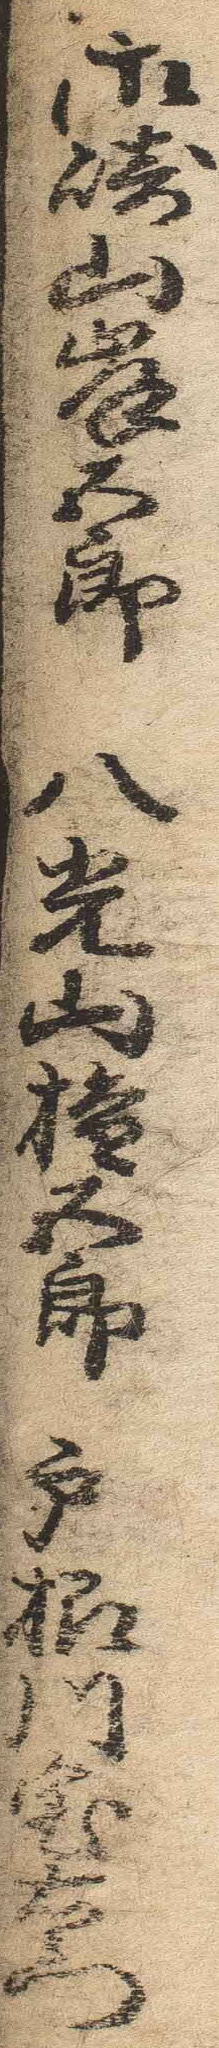御崎山峯五郎八光山橋五郎戸根川亀右衛門
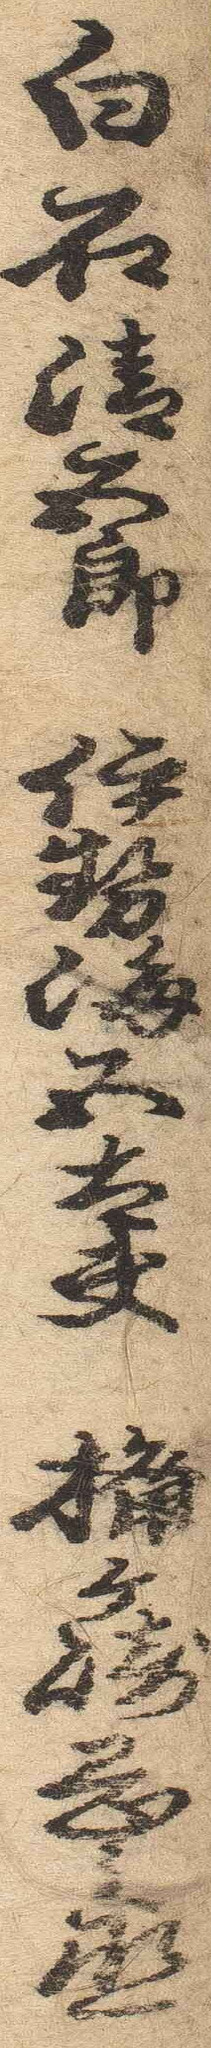白石清五郎伊勢海五太夫楯ケ崎岡之丞
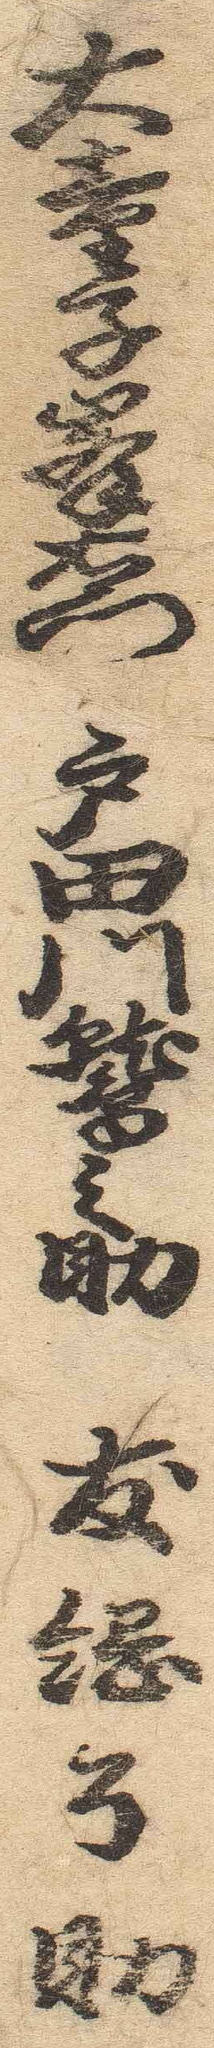大童子峯右衛門戸田川鷲之助友綱了助
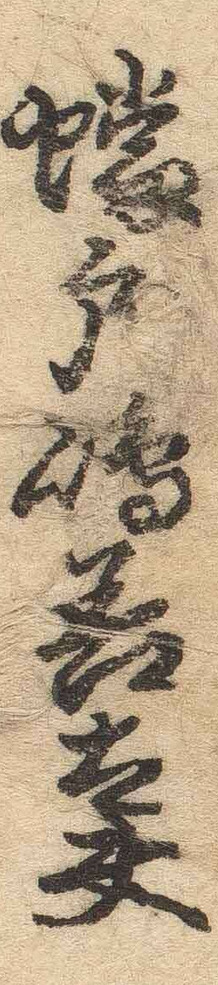蟷戸嶋善太夫
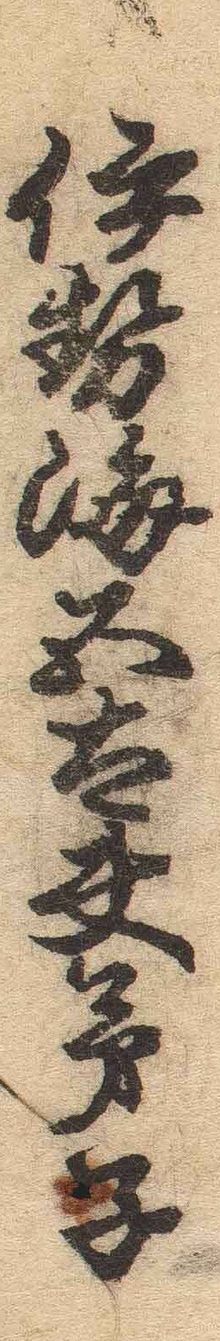江戸伊勢海五太夫弟子
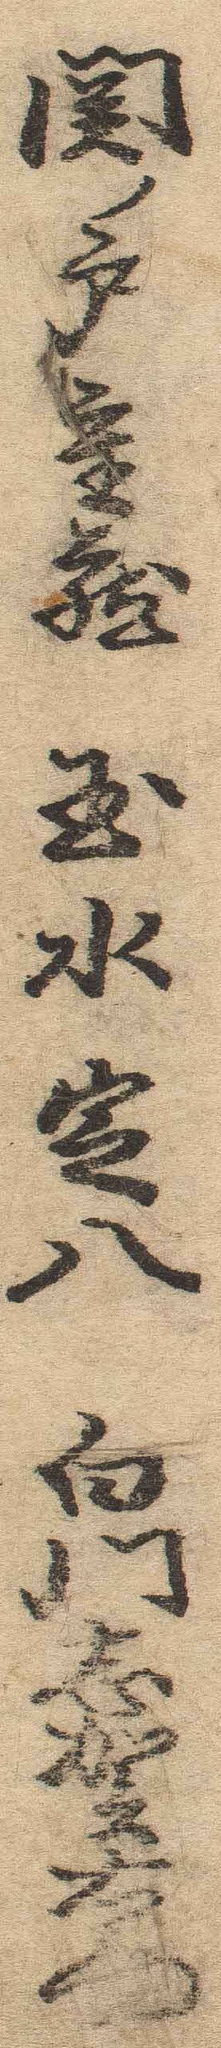関ノ戸重蔵玉水定八白川志賀右衛門
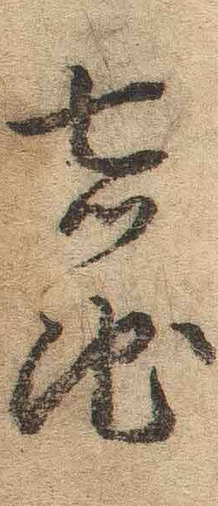七ツ池

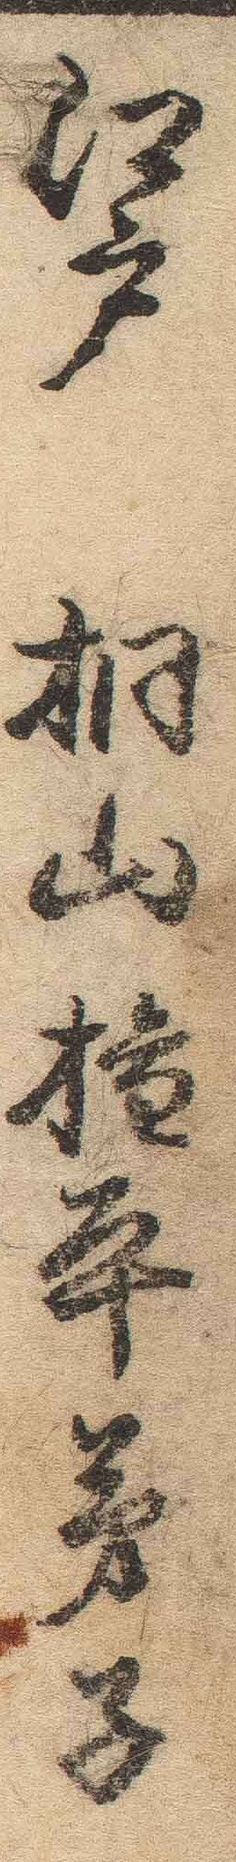江戸桐山権平弟子
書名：古今相撲大全
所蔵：東京学芸大学附属図書館 国文学研究資料館
